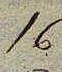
16
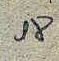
18
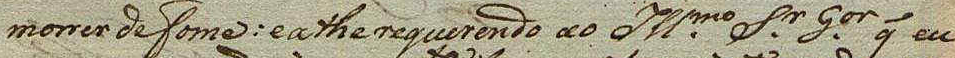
morrer de fome: e athe requerendo ao Illmo. S.r G.or q̄ eu
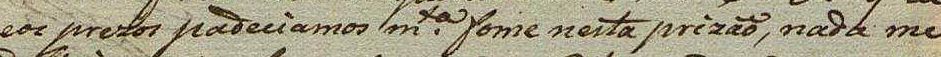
e oz prezos padeciamos mta. fome nesta prizaõ, nada me
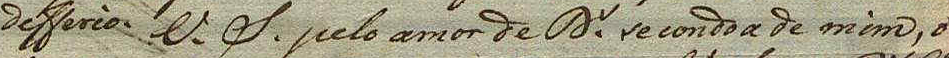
defferio. V.S. pelo amor de D.s se condoa de mim, o
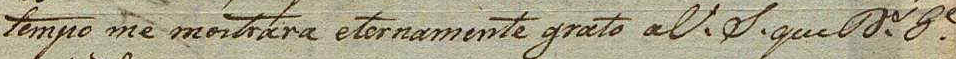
tempo me mostrara eternamente grato a V.S. que D.s G.e
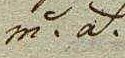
m.s ā.s
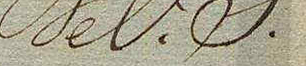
De V. S.
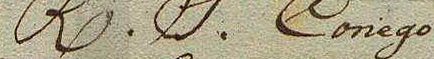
R.mo S.r Conego
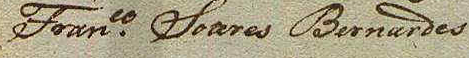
Fran.co Soares Bernardes
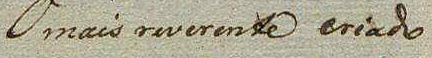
O mais reverente criado
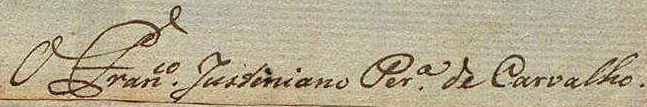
O Franco. Justiniano Per.a de Carvalho.
